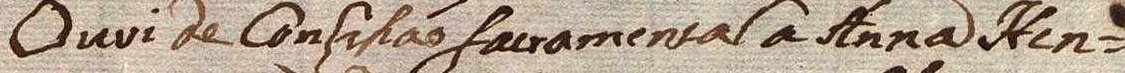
Ouvi de Confissaõ sacramental a Anna Hen
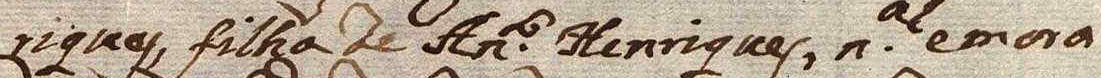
riques, filha de An.to Henriques, n.al e mora
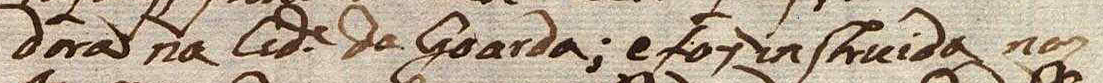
dora na Cid.e da Guarda; e foy instruida nos
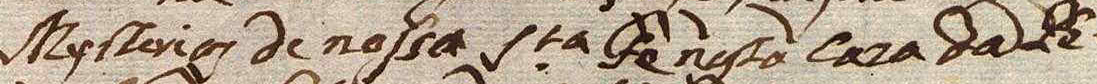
Mysterios de nossa s.ta Fé nesta caza da Pe
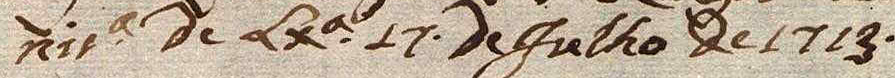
nit.a de Lxa. 17. de Julho de 1713.
